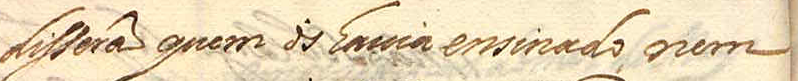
disseraõ quem os hauia ensinado nem
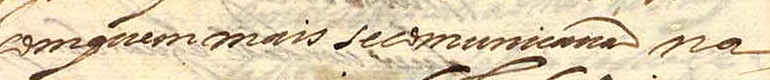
com quem mais se comunicauaõ na
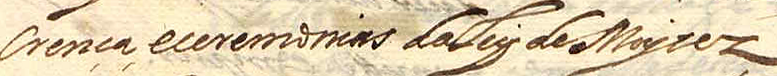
crença, e ceremonias da Ley de Moysez,
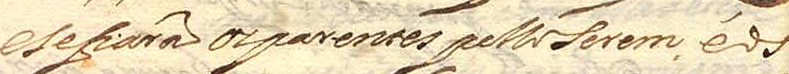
e se fiaraõ os parentes pello serem, e os
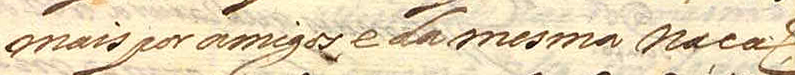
mais por amigos e da mesma naçaõ,
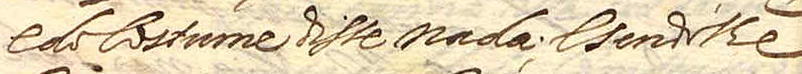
e do costume disse nada; e sendolhe
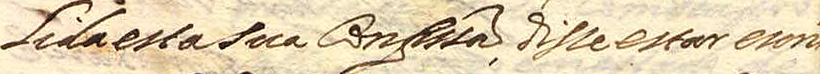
Lida esta sua confissão, disse estar escri_
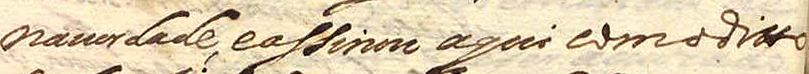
na uerdade, e assinou aqui com o ditto
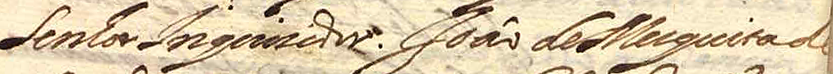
Senhor Inquizidor. João de Mesquita de
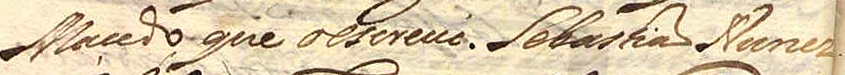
Maçedo que o escreui. Sebastiaõ Nunez
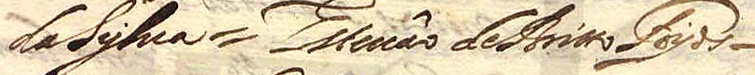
da Sylua = Esteuão de Britto Foyos
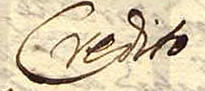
Credito
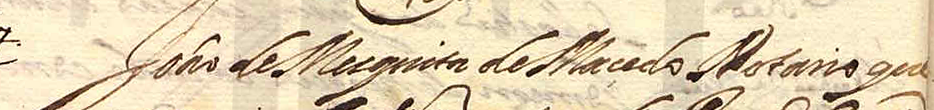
João de Mesquita de Maçedo Notario que
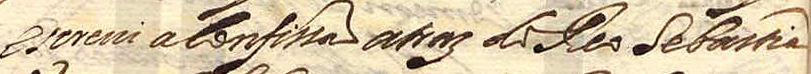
escreui a confissaõ atraz do Reo Sebastiã_
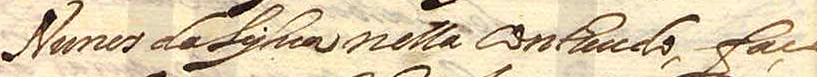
Nunes da Sylua nella contheudo, faç_
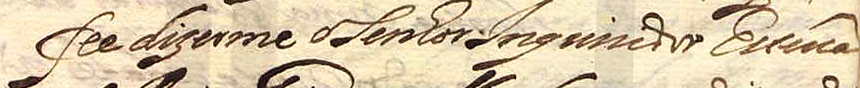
fee dizerme o Senhor Inquizidor Esteuã_
